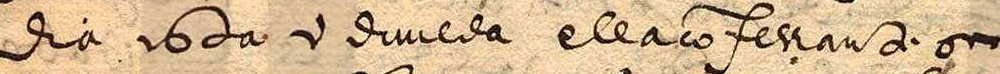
dia esta e̅ duueda ella co̅fessante se
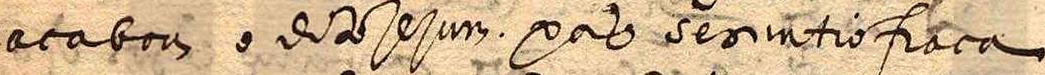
acabou o dito Jejum porq̅ se sentio fraca
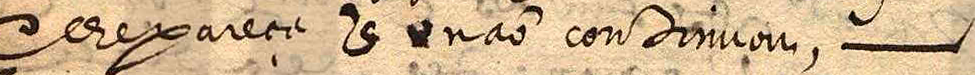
e lhe pareçe q̅ o não continuou,
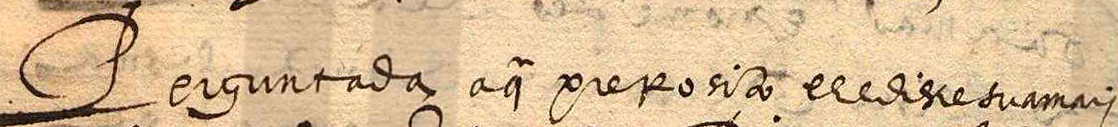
Perguntada a q̅ preposito lhe disse sua may
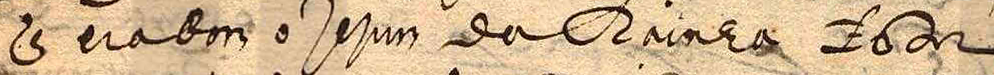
q̅ era bom o Jejum da Rainha Ester
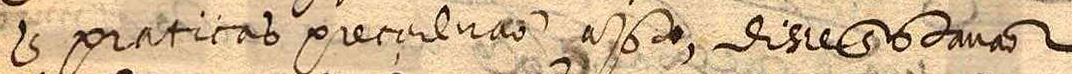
q̅ praticas preçederão a jsto, disse q̅ estauão
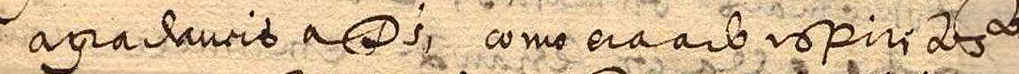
agradaueis a D̅s, como era a do espirito sto
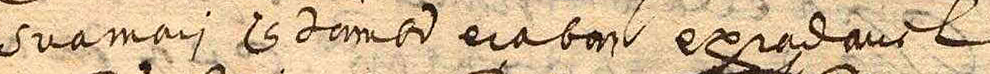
sua maj q̅ tambe̅ era bon e gradaueL
